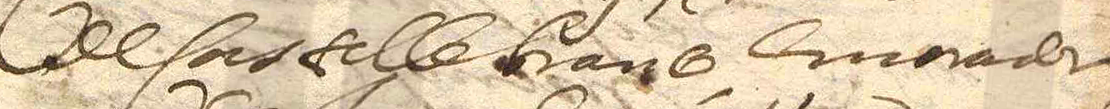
de Castello branco, E morador
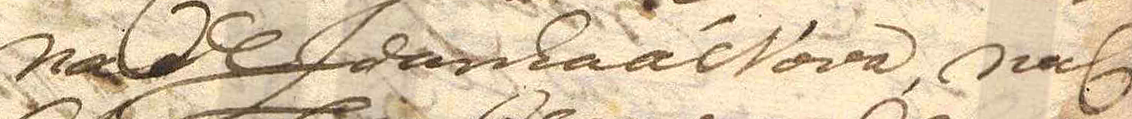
na de Jdanha a Nova, naõ
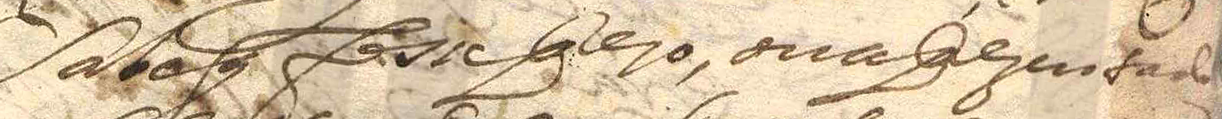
Sabe q̄ fosse prezo, ou aprezentado
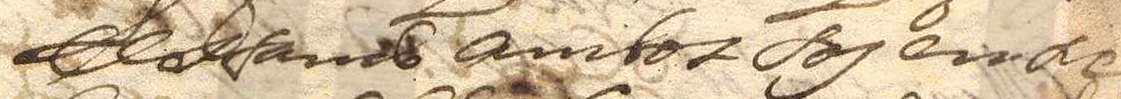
e estando ambos sos entre
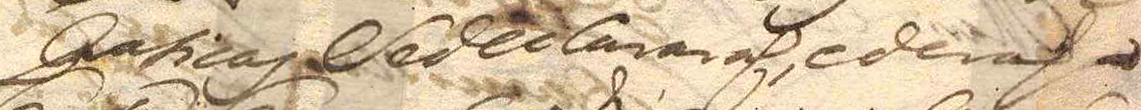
pRaticas se declararaꝭ, e deraõ a
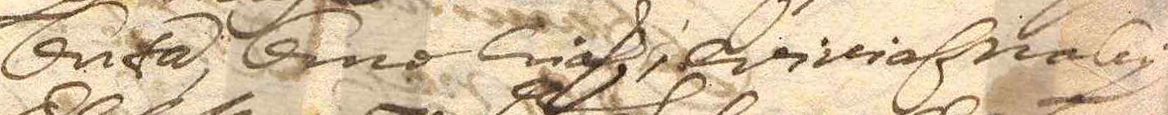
Conta, Como Criaõ, e viuiaꝭ na ley
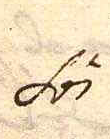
sós
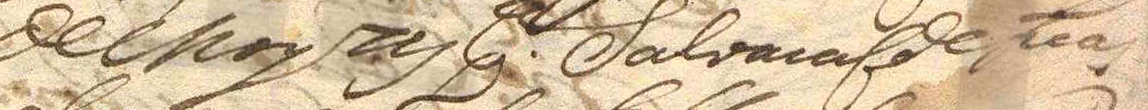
de Moyzes p.a Salvaçaꝭ de suas
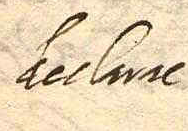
declaraç
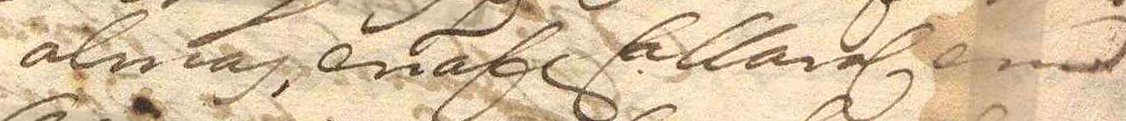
almas, e naõ fallaraꝭ em
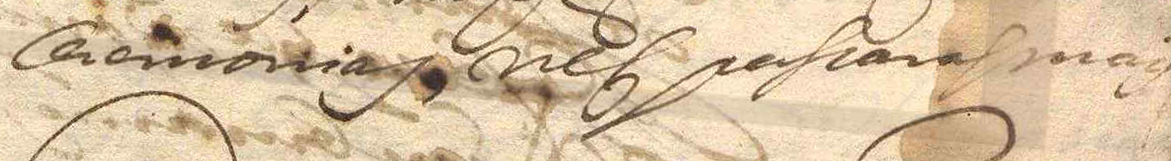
Ceremonias, neꝭ passaraꝭ mais
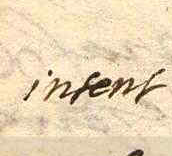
intent
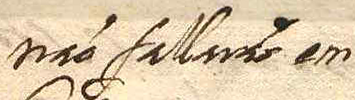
naõ fallarão em
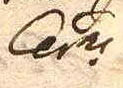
Cera.s
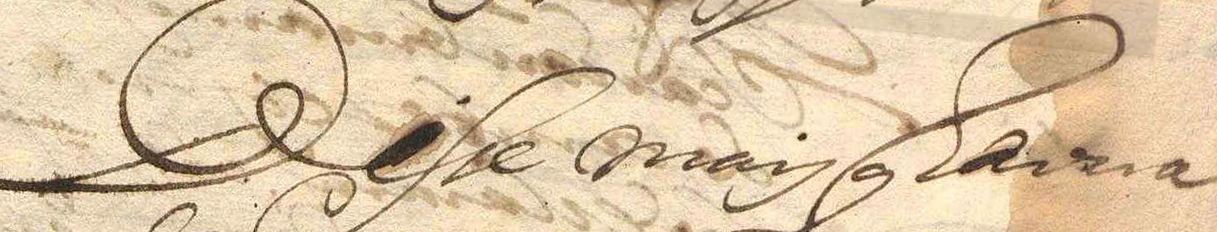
Disse mais q̄ havera
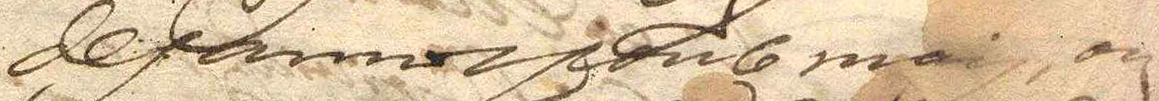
des annos pouco mais, ou
